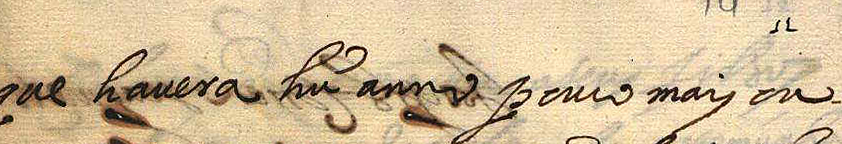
que hauera hū anno pouco mais ou
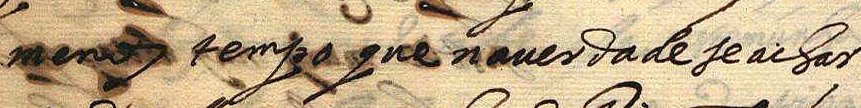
menos tempo que na uerdade se achar
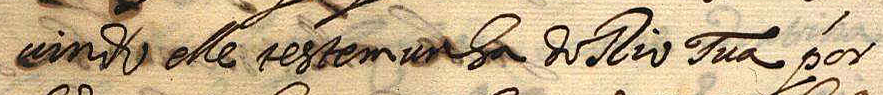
uindo elle testemunha do Rio Tua por
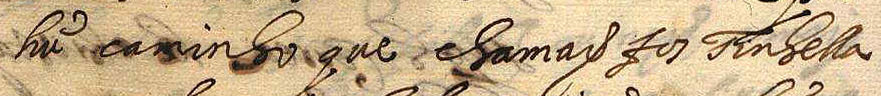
hū caminho que chamaõ fos Tinhella
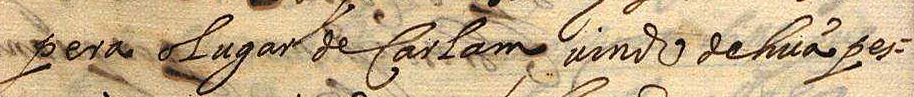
pera o Lugar de Carlam, uindo de huā pes
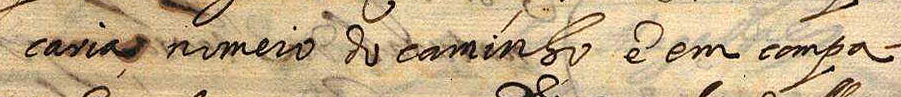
caria no meio do caminho e em compa
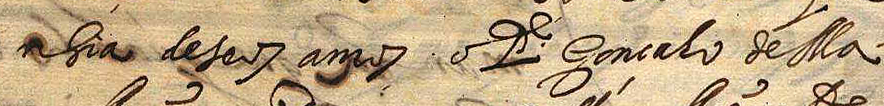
nhia de seos amos o P.e Gonçalo de Ma
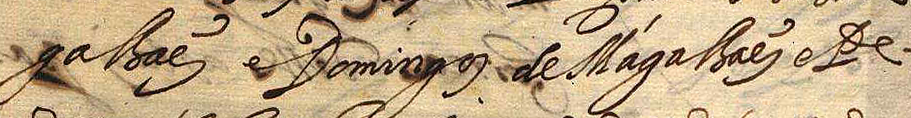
galhaẽs e Domingos de Magalhaẽs e Pe
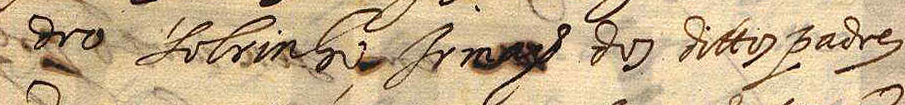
dro Sobrinho, Jrmaõ dos dittos padres
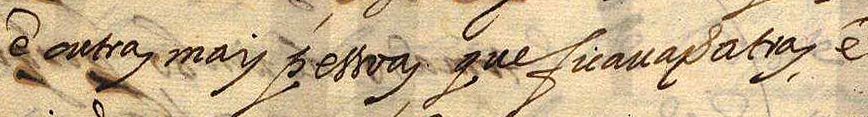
e outras mais pessoas que ficauaõ atras, e
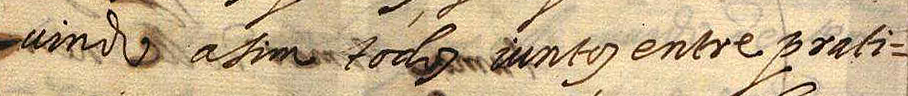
uindo asim todos iuntos, entre prati
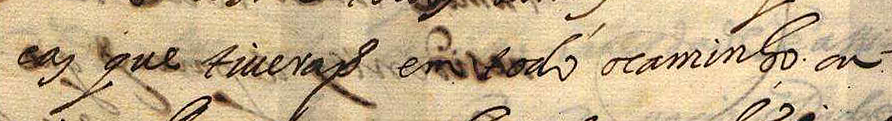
cas que tiueraõ em todo o caminho; ou
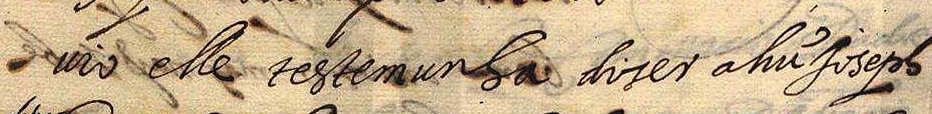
uio elle testemunha dizer a hū Joseph
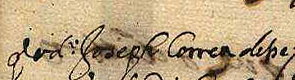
q̄ o d.o Jozeph Correa disse
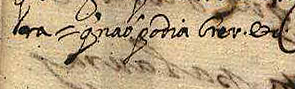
ra = q̄ naõ podia Crer &c
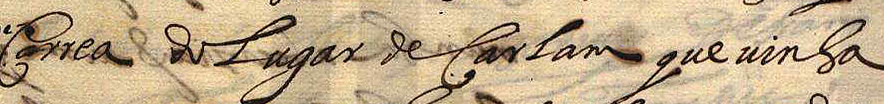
Correa do Lugar de Carlam que uinha
